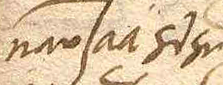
não Jaa sē se
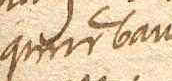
querer̄ bau
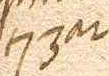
tjzar.
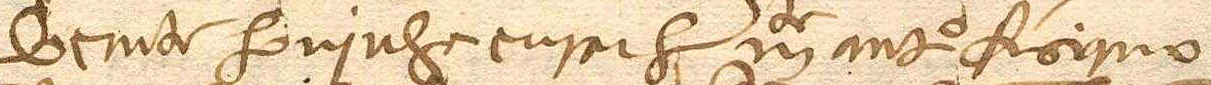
doemte ho ujnha curar hū mte anto fisiquo
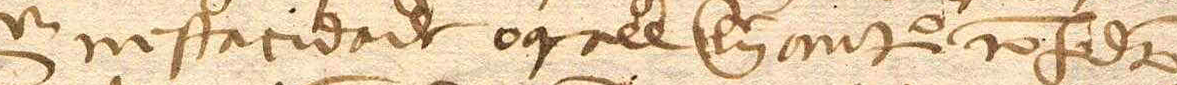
mor nesta çidade o quall mte anto c̄o ho dt̄o
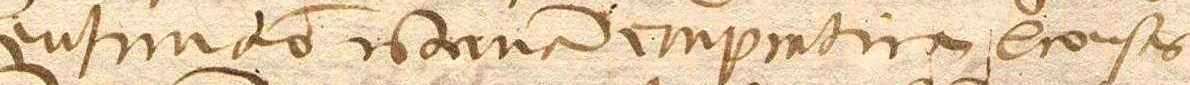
seu Jrmaõ estauā em pratica e cousas
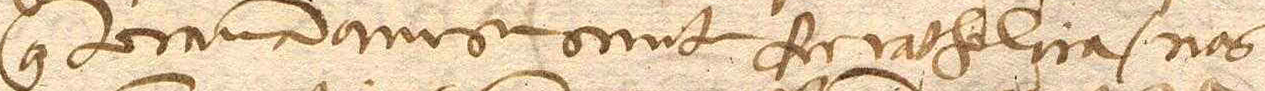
q̄ tocauā a nosa santa fee catholica / nas
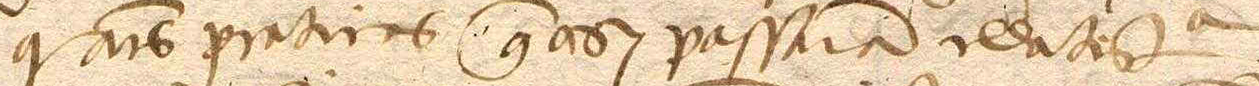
quāes praticas q̄ asy passarā ella testa
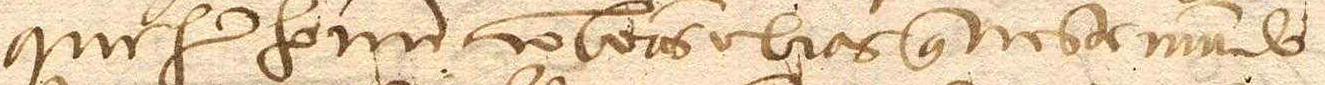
que hū homē c̄o boās obras q̄ neste mūdo
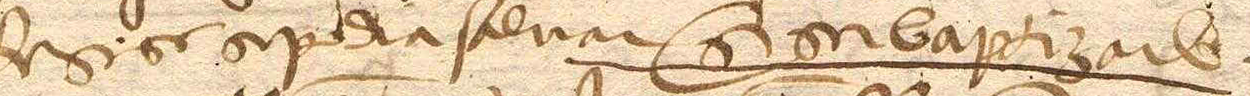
fezese se podia saluar sē ser baptizado
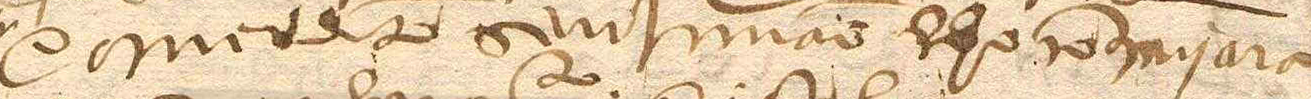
e que o dit̄o seu Jrmão lho c̄otrarjara
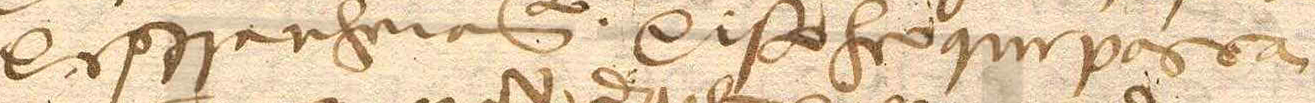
e estranhara mto. e isto he o que passa
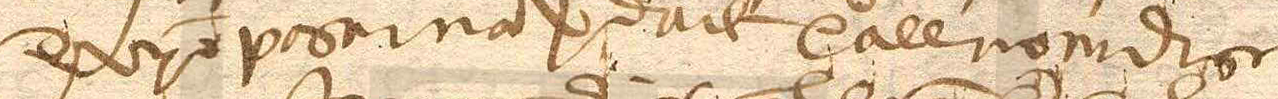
e vyo pasar na ꝟdade e all nom dise
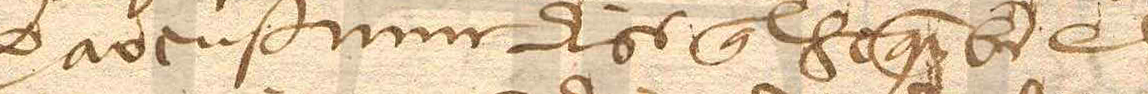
e ao custume dise q̄ lhe q̄r bē e he
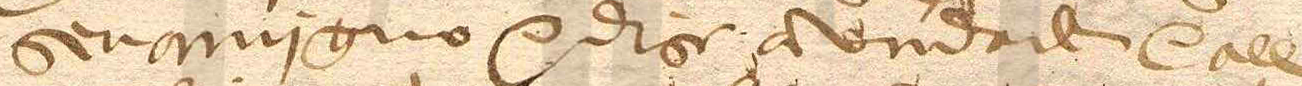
seu amjguo e dise a verdade e all
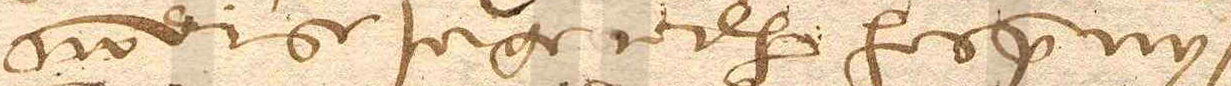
n̄o dise Jorge coelho ho sp̄uy /
